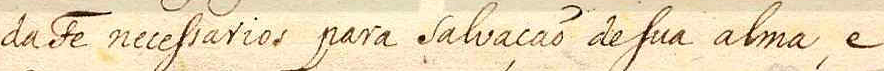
da Fe necessarios para salvaçaõ de sua alma, e
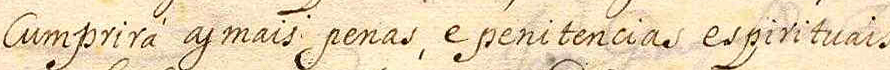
Cumprirá as mais penas, e penitencias espirituais
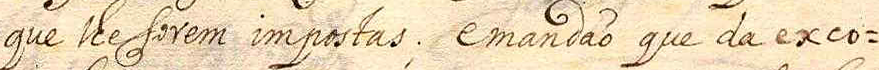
que lhe forem impostas; e mandão que da exco
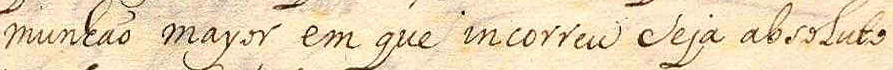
munhaõ mayor em que incorreu Seja absoluto
